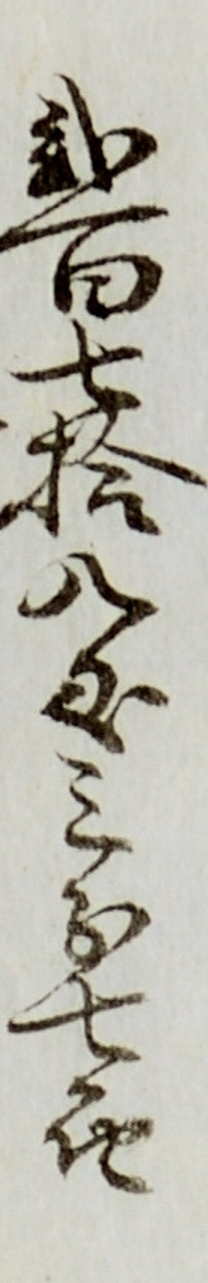弐百七拾八匁三分七厘四公
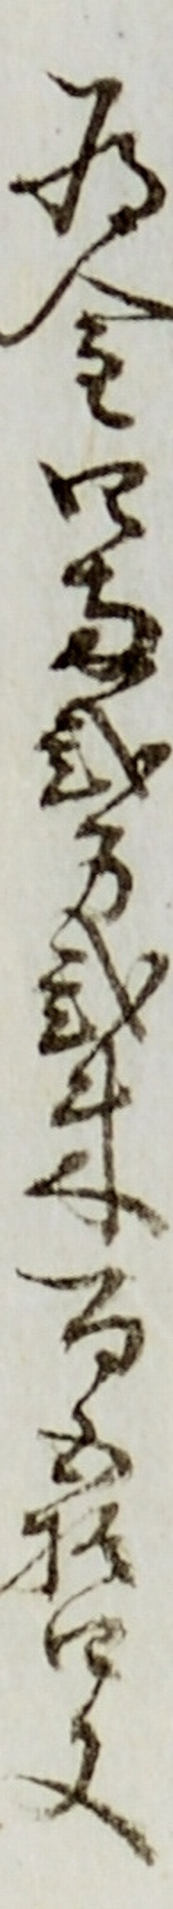為金四両弐分弐朱百五拾四文
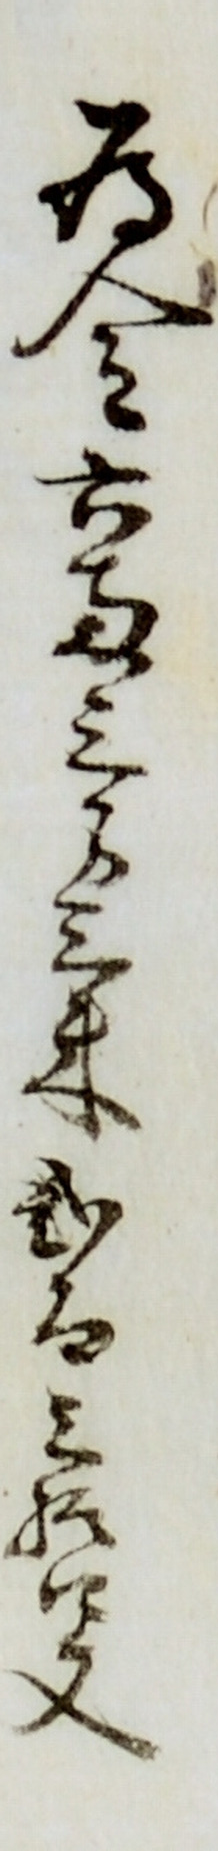為金六両三分三朱弐百三拾四文
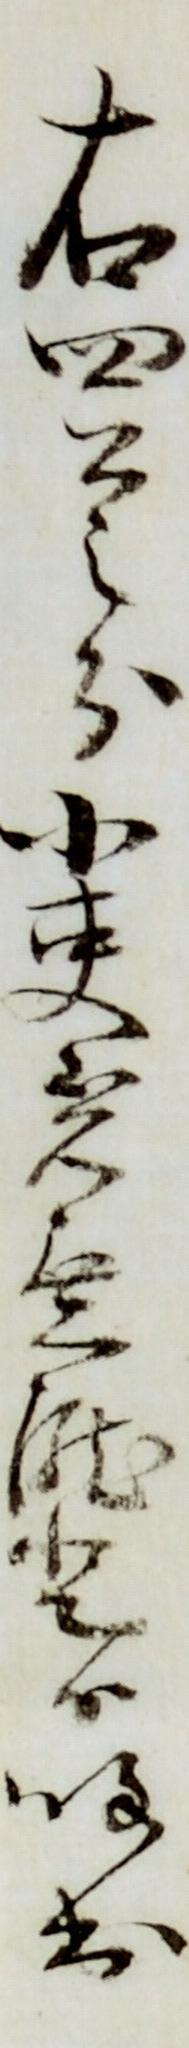右四公之分小吏岩垂滝登ゟ呼出
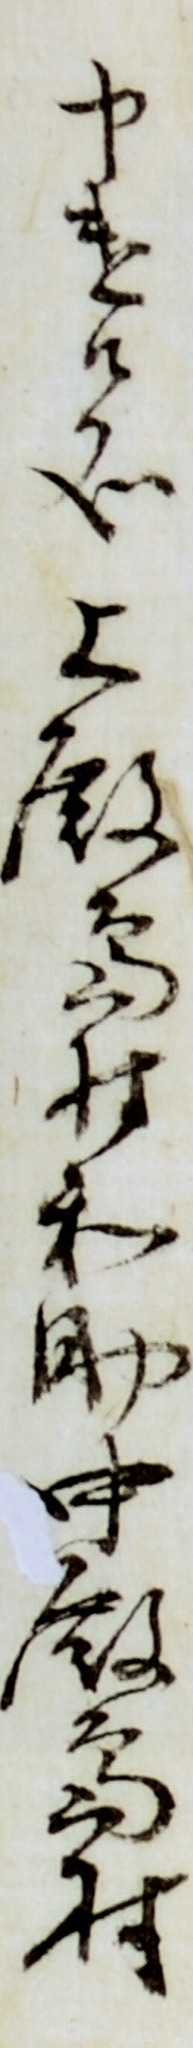申遣候処上殿島村和助中殿島村

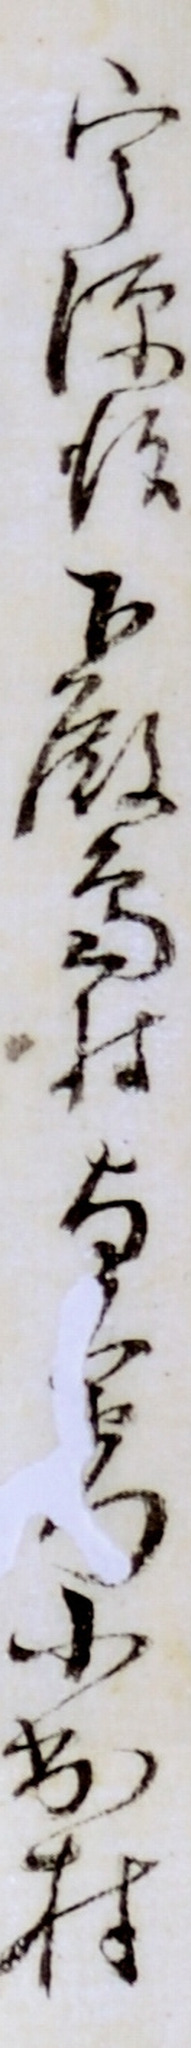宇源治下殿島村与右衛門小出村
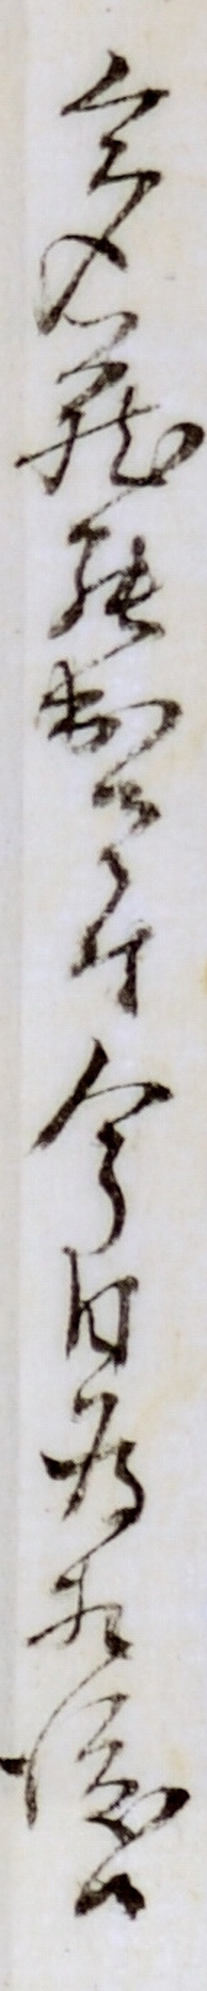多蔵罷出候に付今日為相渡候
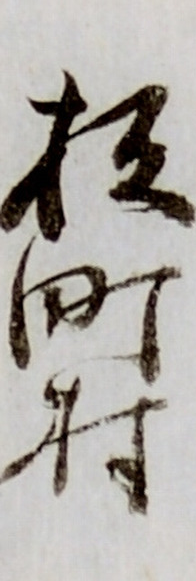板町村
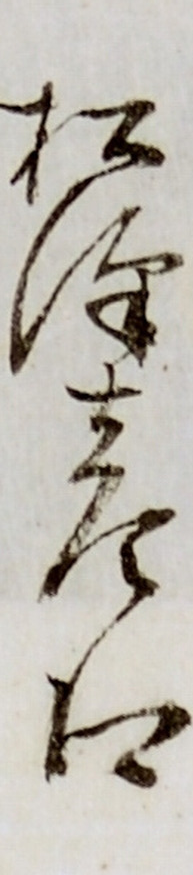松沢彦郷
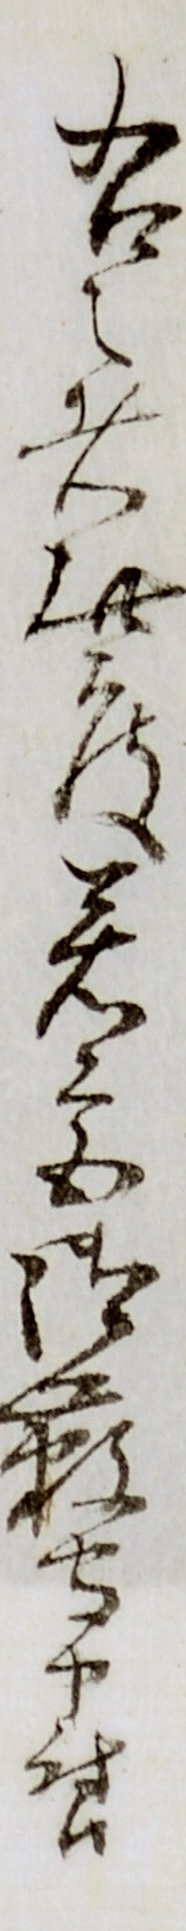右之者此度若宮御薮守申付候
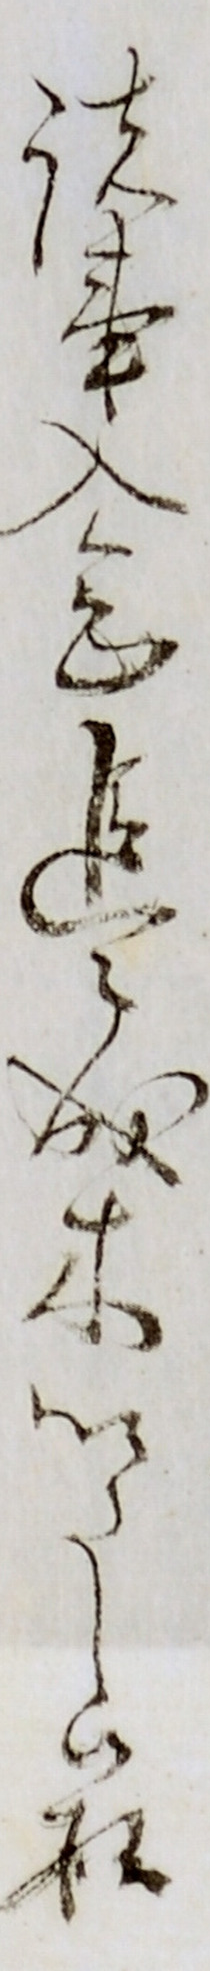諸事入念追々成木いたし候様
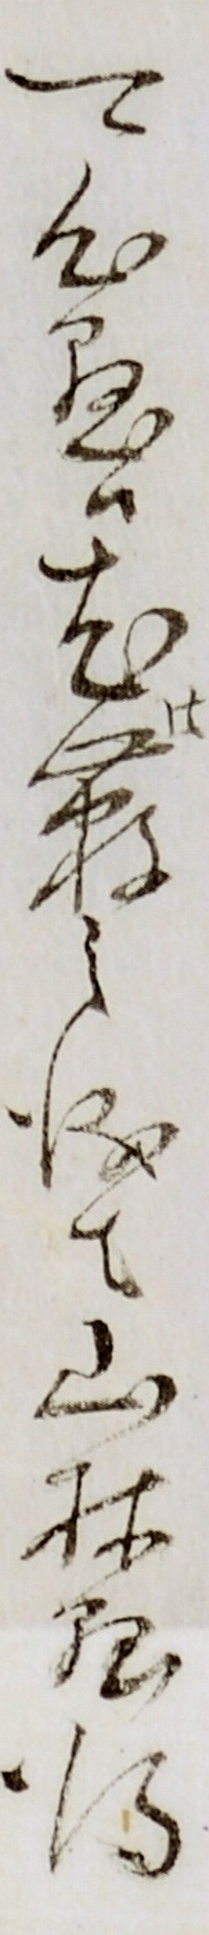可心懸候尤御薮之儀は山林懸得
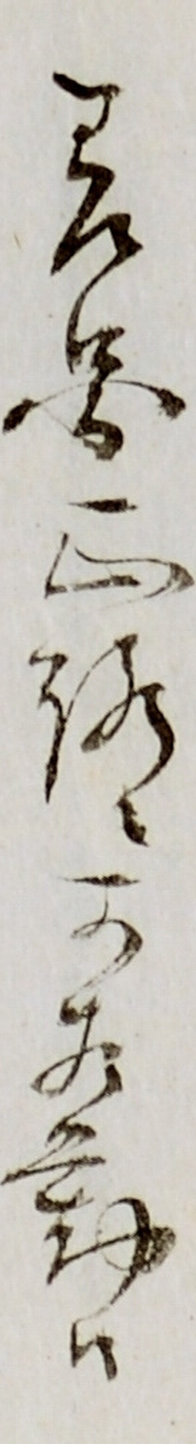差図正路に可相勤候
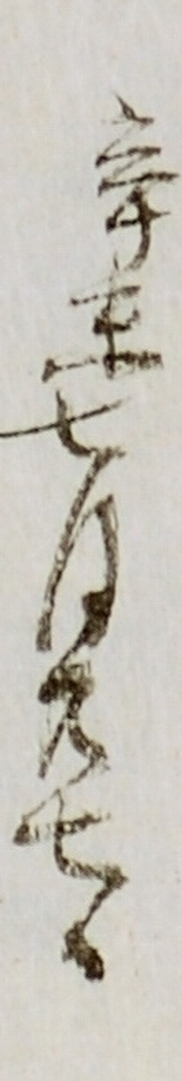辛未七月廿七日
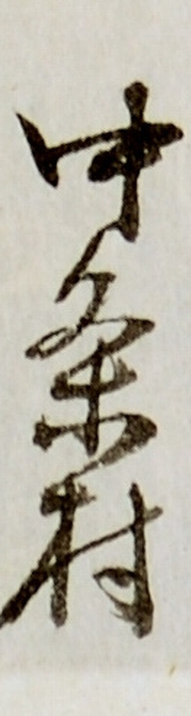中条村
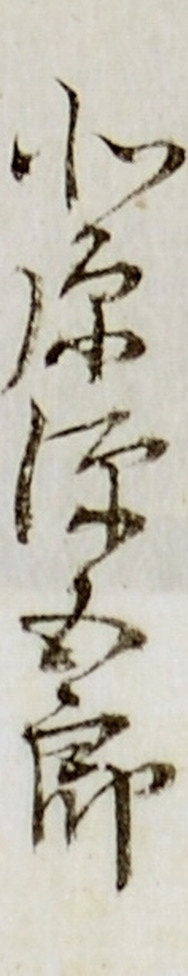北原源五郎
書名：山林方諸事御用留
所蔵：伊那市立高遠町図書館・合同会社AMANE
